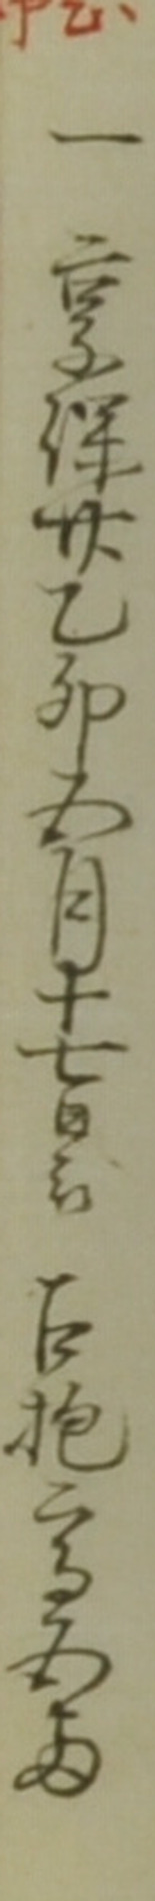一享保廿乙卯五月十七日被召抱高五両

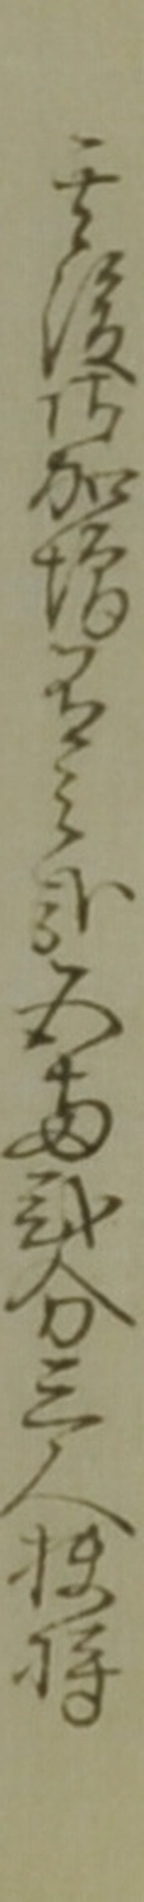其後御加増有之哉五両弐分三人扶持
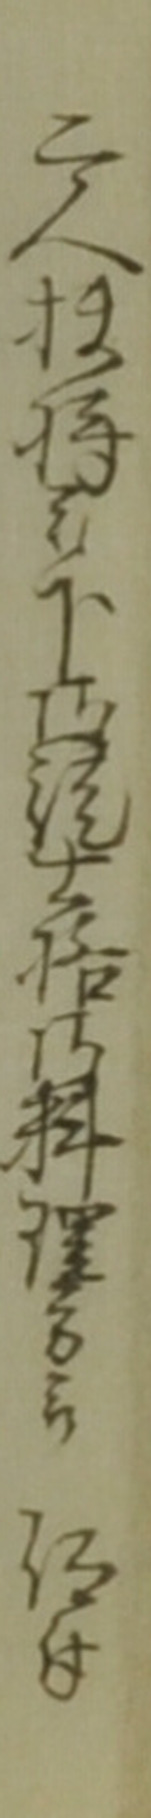二人扶持被下御徒士格御料理方被仰付
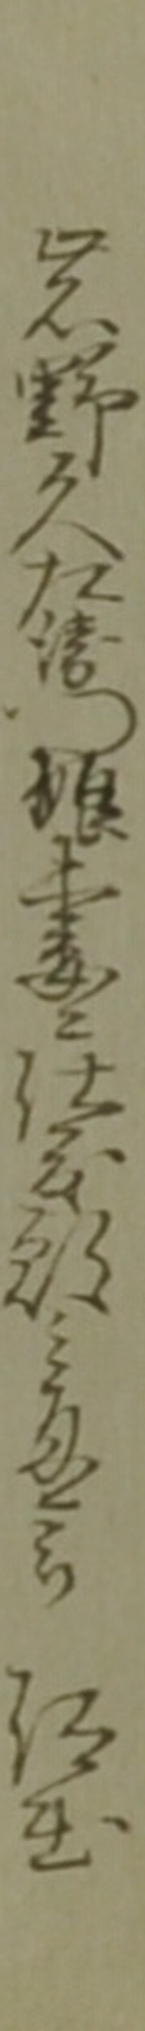荒野久左衛門娘妻仕度願之通被仰出
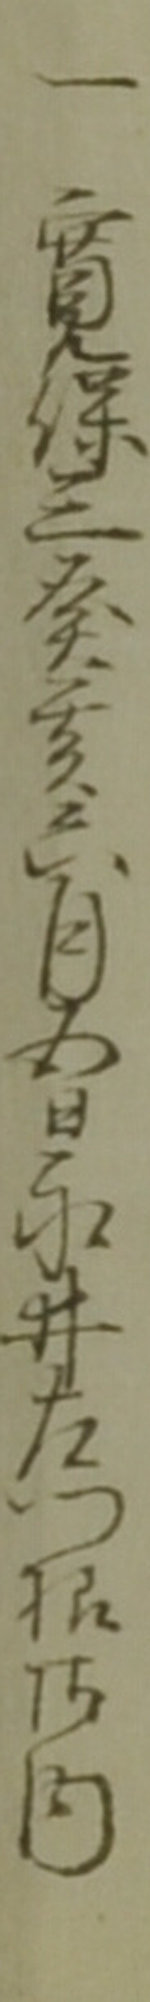一寛保三癸亥六月五日永井左門様御内
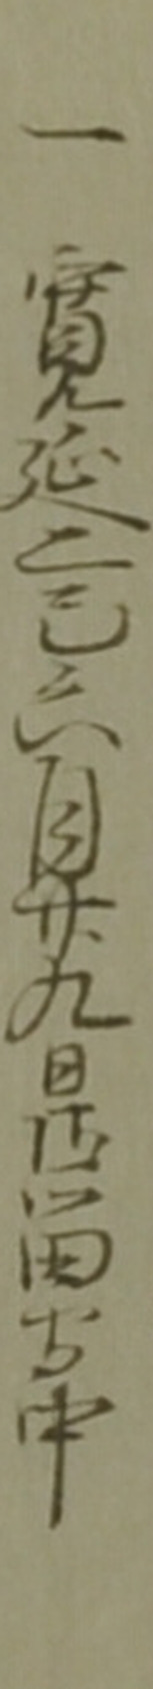一寛延二巳六月廿九日御留守中
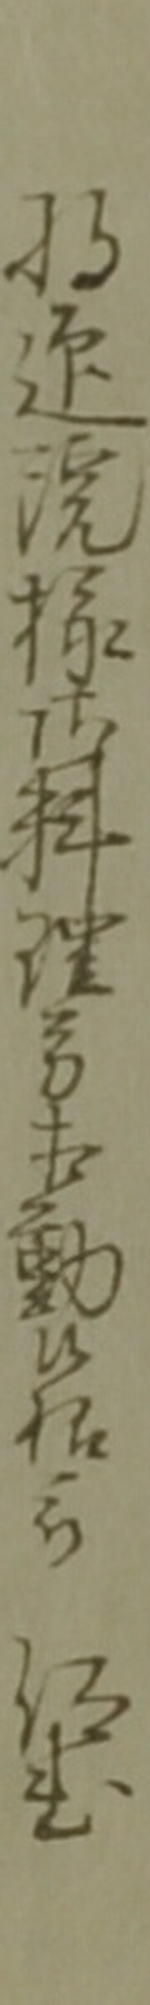将迎院様御料理方相勤候様被仰出
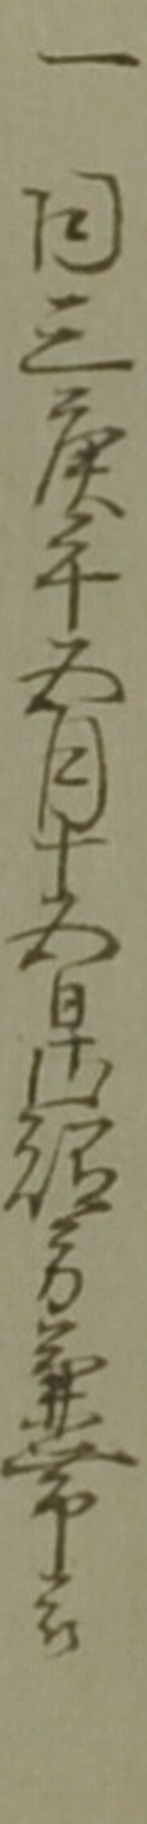一同三庚午五月十五日御賄方兼帯被
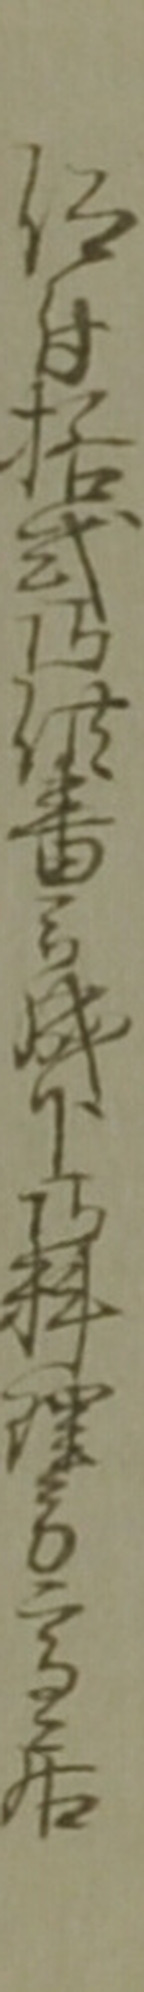仰付格式御供番被成下御料理方高居
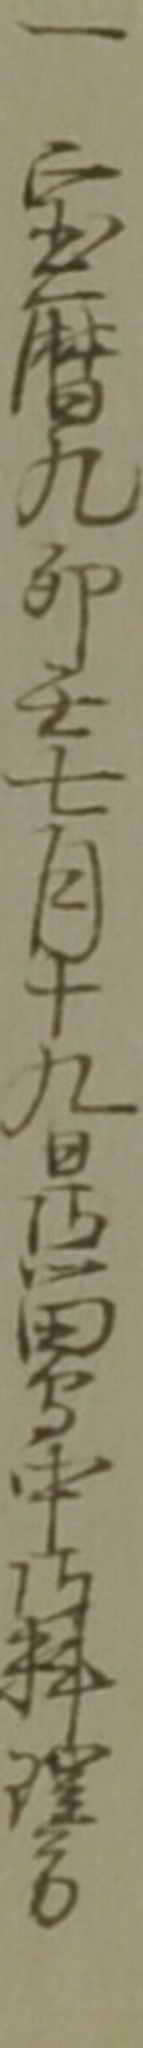一宝暦九卯閏七月十九日御留守中御料理方
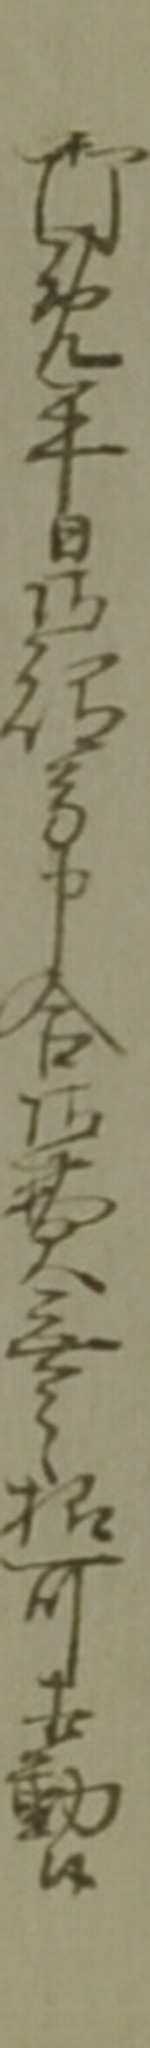御免平日御賄方申合御費無之様可相勤候
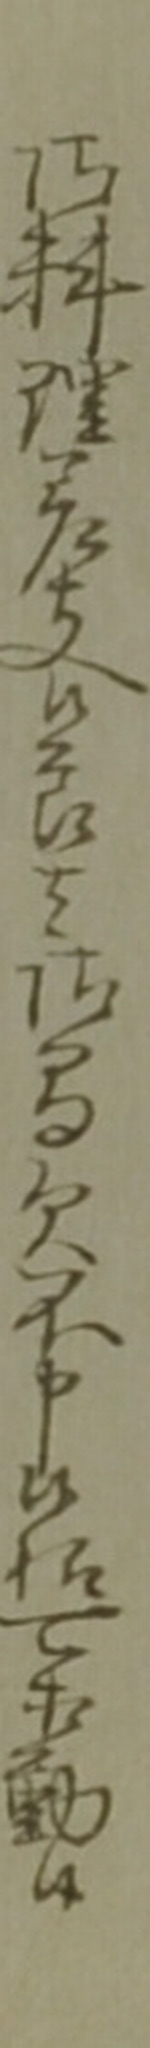御料理差支候節者御間欠不申候様可相勤候
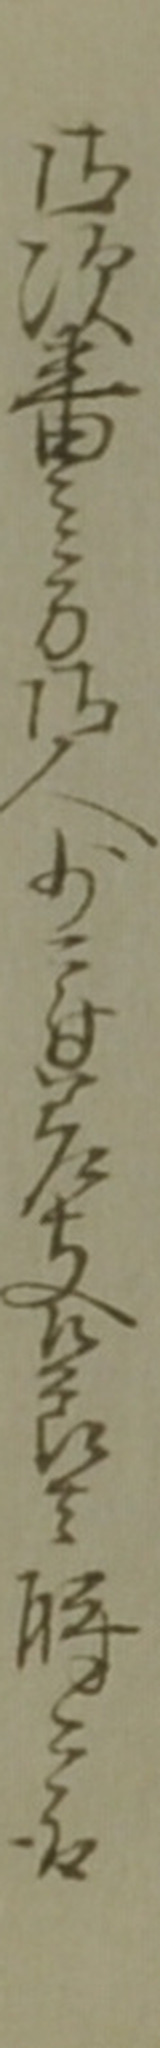御次番之方御人少ニ付差支候節者時々取
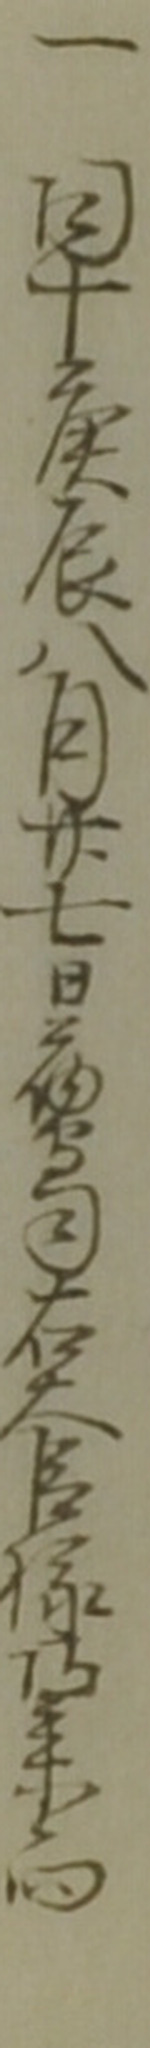一同十庚辰八月廿七日鷹司右大臣様御参向
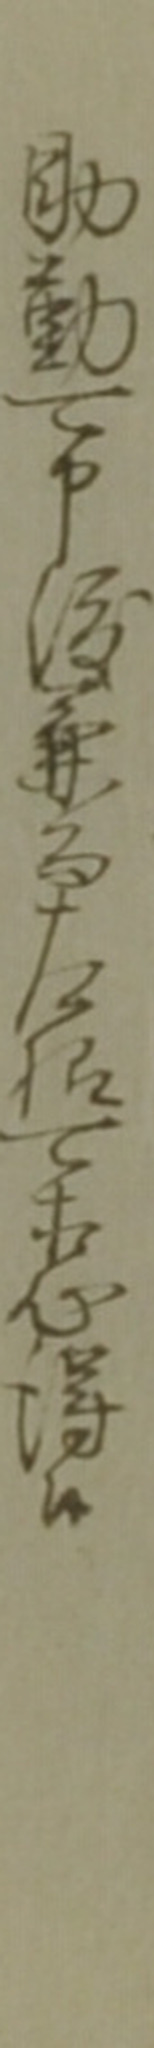助勤可申渡兼而左様可相心得候
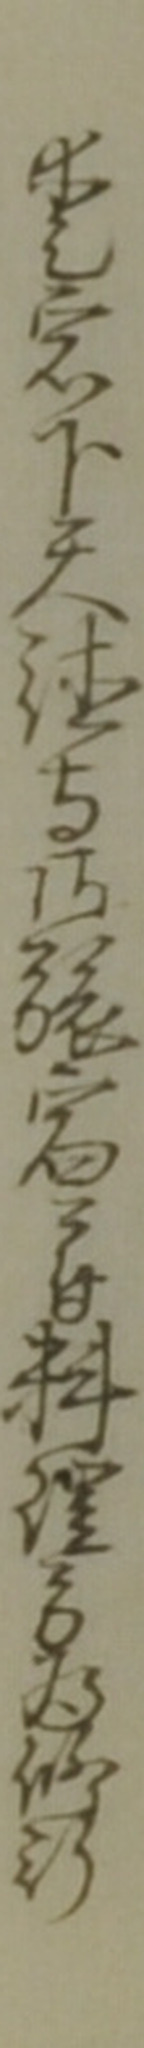愛宕下天徳寺御旅宿ニ付料理方為修行
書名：無足廃家（壱）
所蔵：伊那市立高遠町図書館・合同会社AMANE
